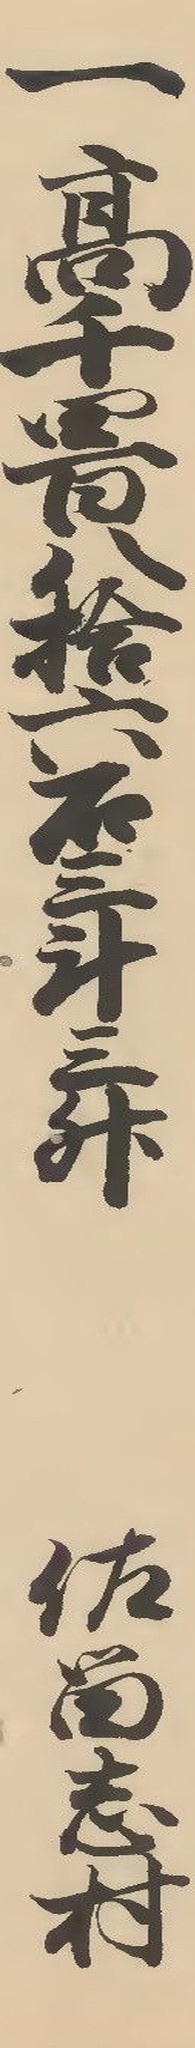一髙千四百八拾六石三斗三升佐留志村
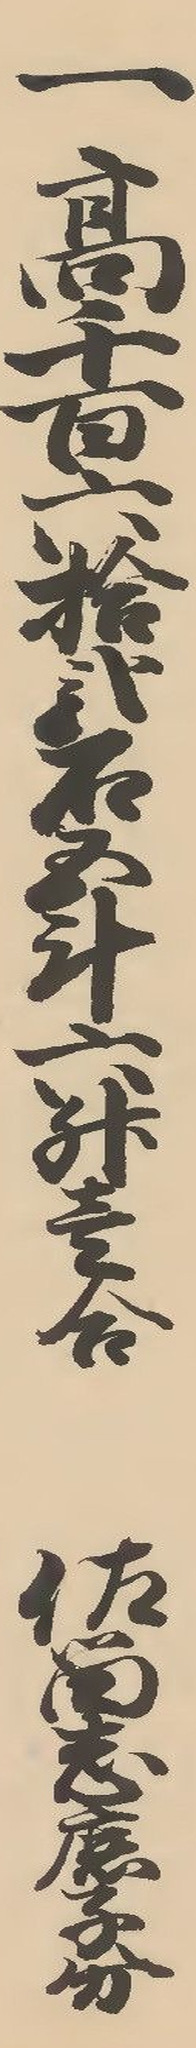一髙千百六拾弐石五斗六升壱合佐留志子分
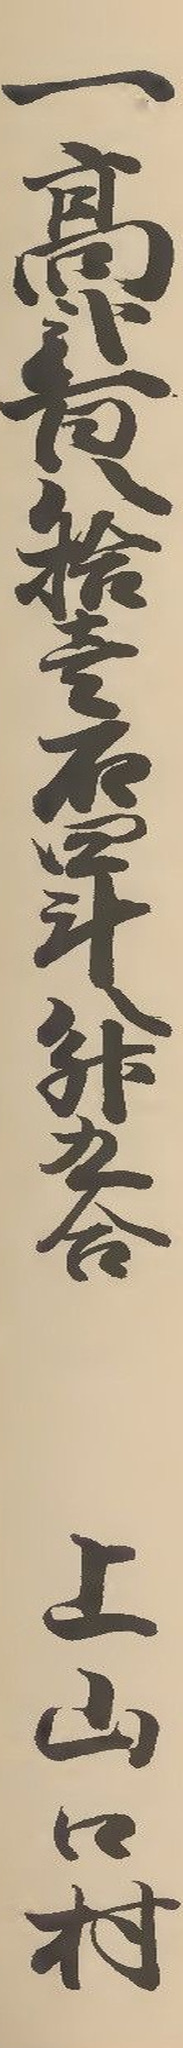一髙弐百八拾壱石四斗八升九合上山口村
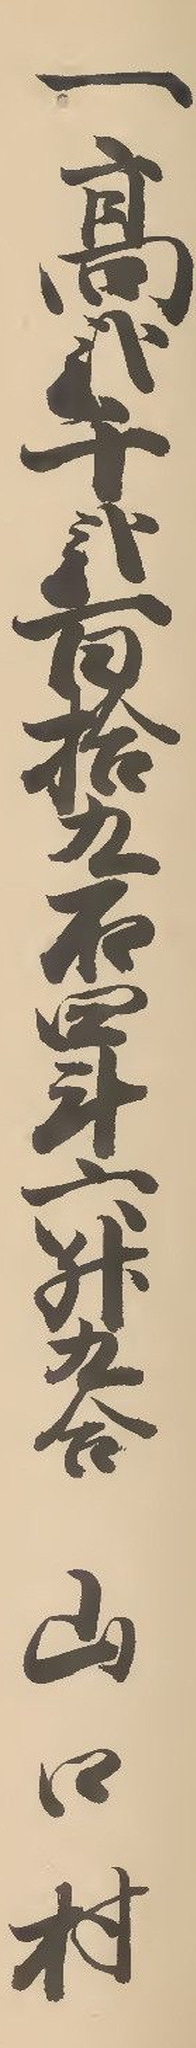一髙弐千弐百拾九石四斗六升九合山口村
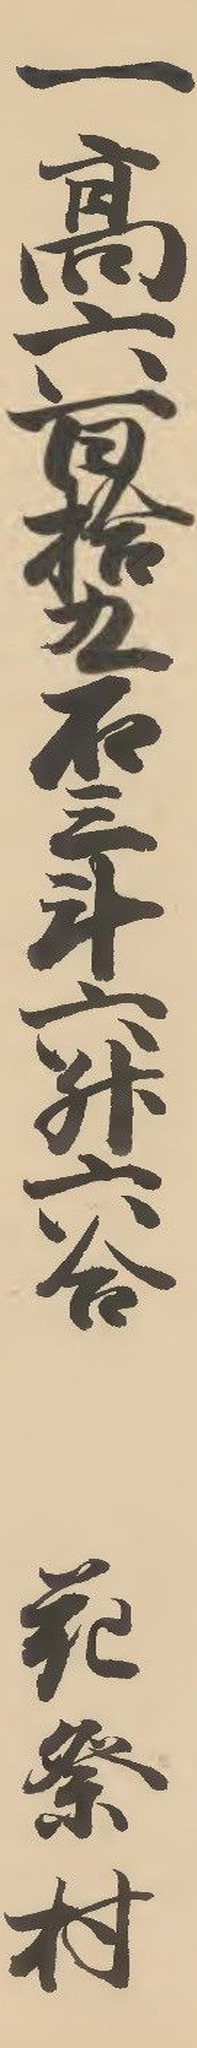一髙六百拾九石三斗六升六合花祭村
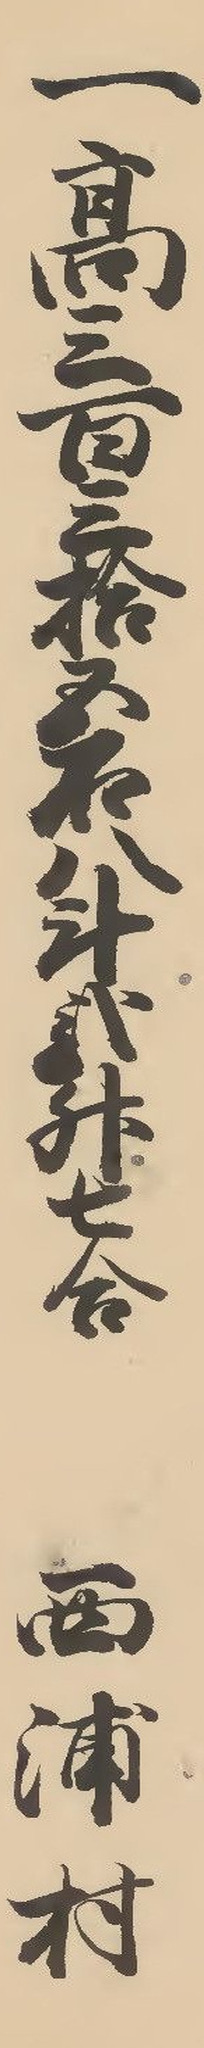一髙三百三拾五石八斗弐升七合西浦村
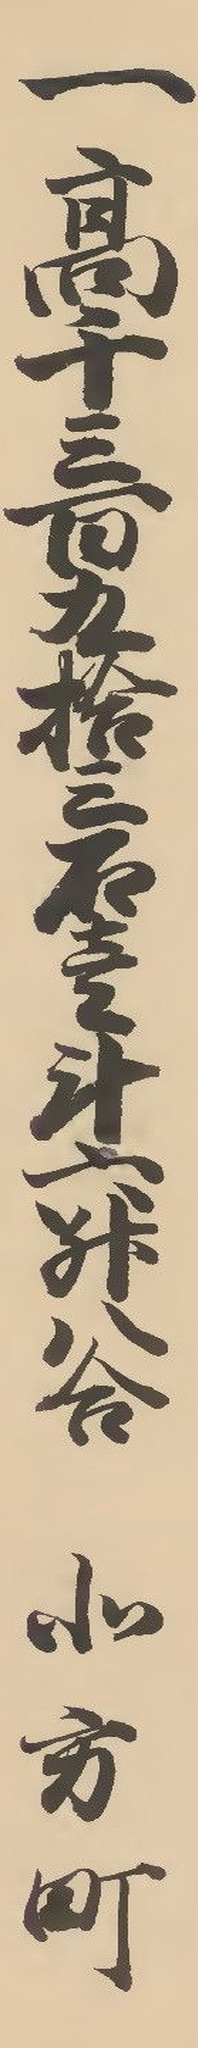一髙千三百九拾三石壱斗六升八合北方町

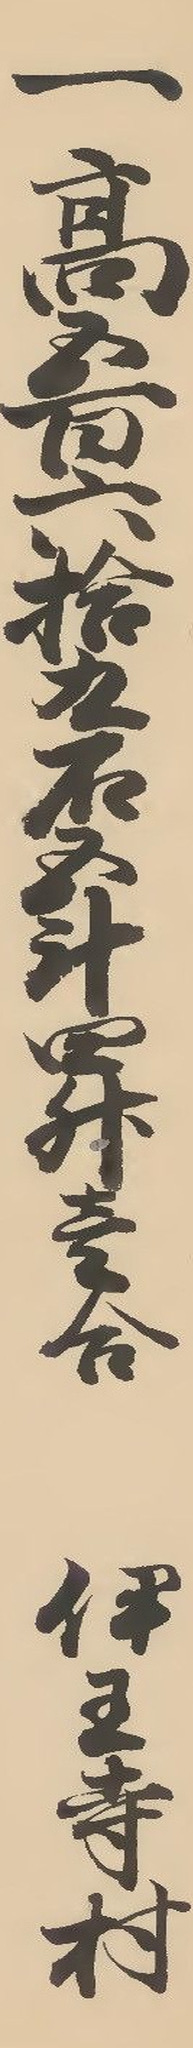一髙五百六拾九石五斗四升壱合伊王寺村
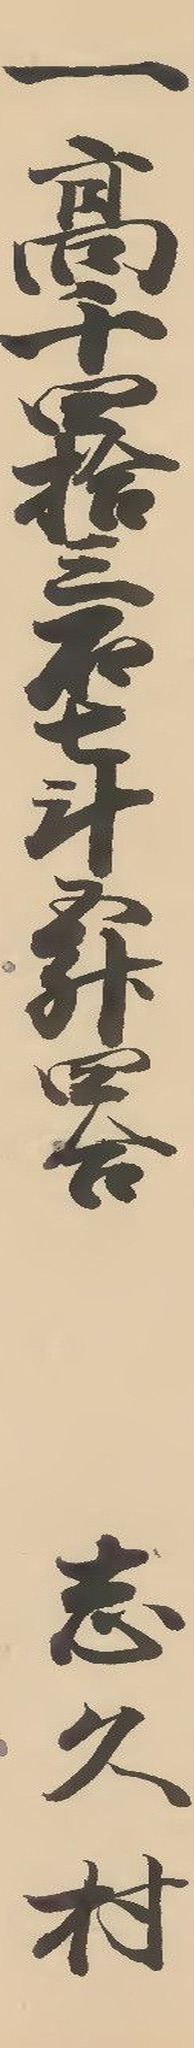一髙千四拾三石七斗五升四合志久村
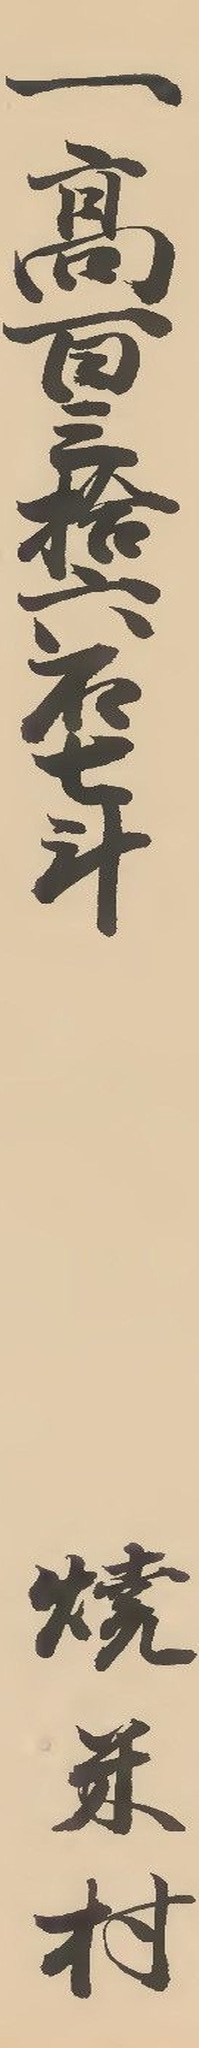一髙百三拾六石七斗焼米村
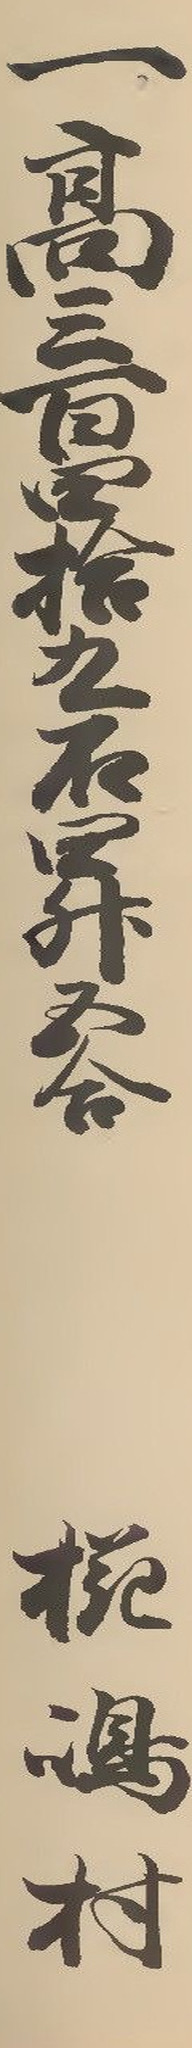一髙三百四拾九石四升五合椛嶋村
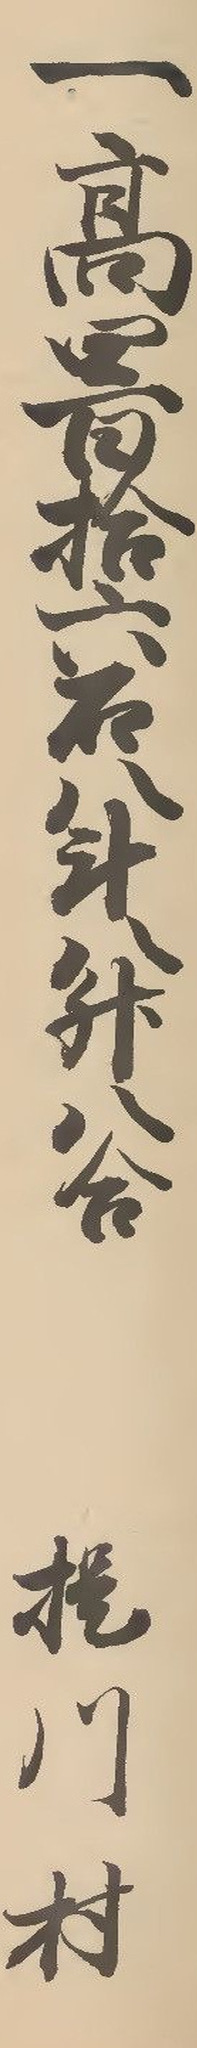一髙四百拾六石八斗八升八合梶川村
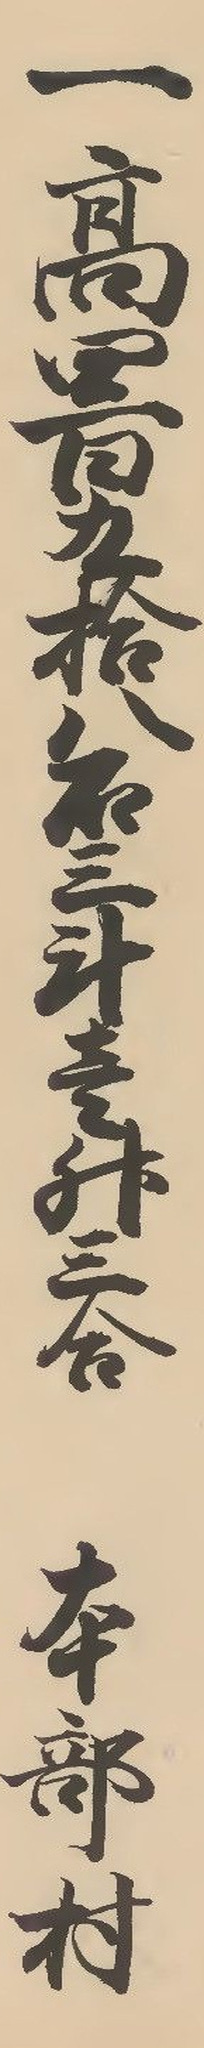一髙四百九拾八石三斗壱升三合本部村
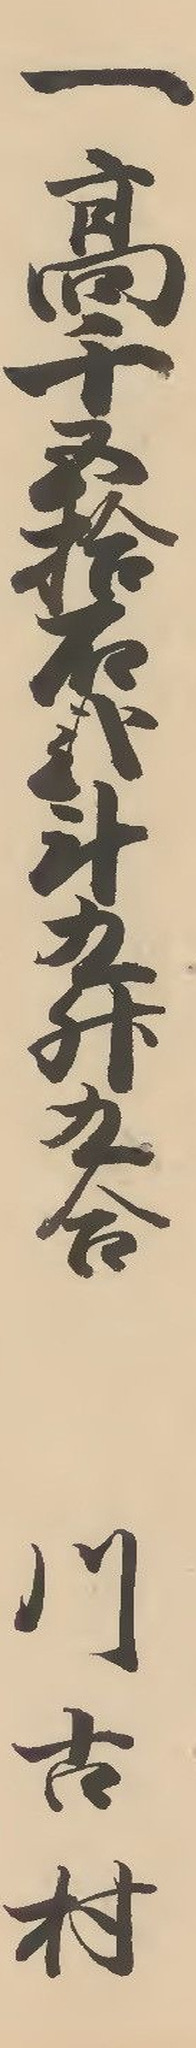一髙千五拾石弐斗九升九合川古村

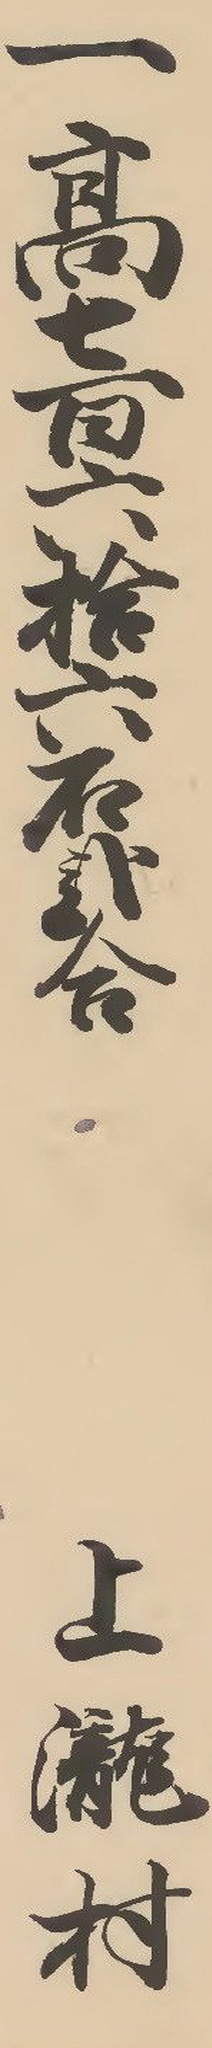一髙七百六拾六石弐合上瀧村
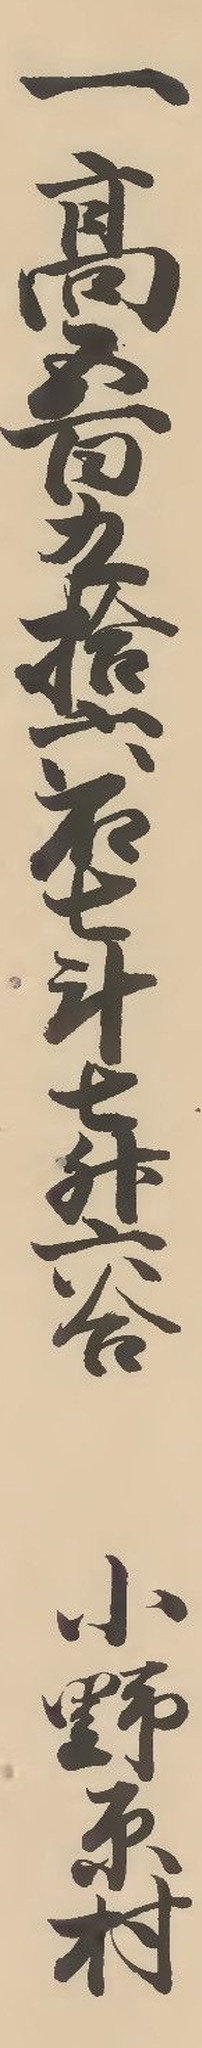一髙五百九拾六石七斗七升六合小野原村
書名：肥前国郷帳
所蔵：国立公文書館 National Archives of Japan
